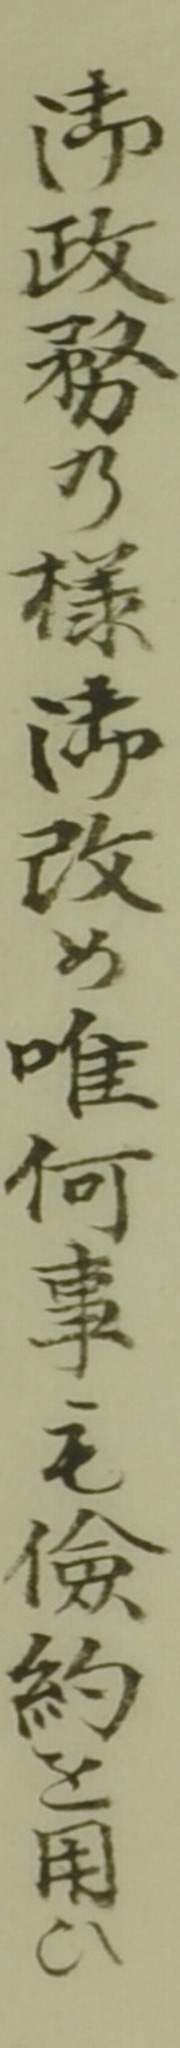御政務の様御改め唯何事も倹約を用ひ
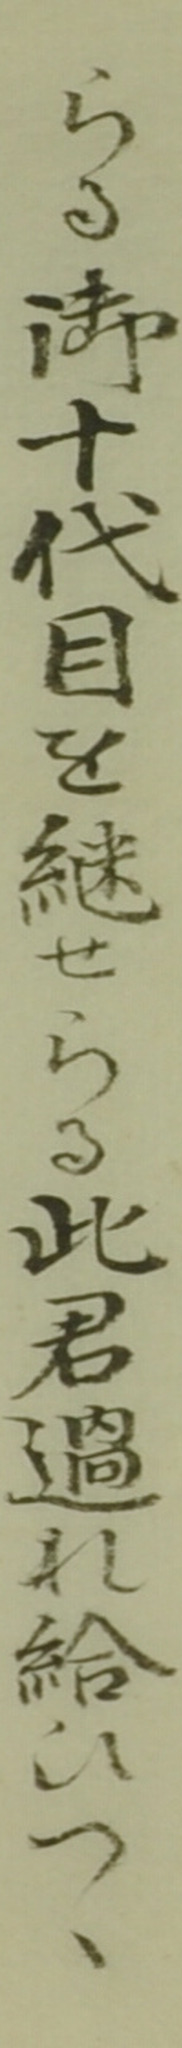らる御十代目を継せらる此君過れ給ひつゝ
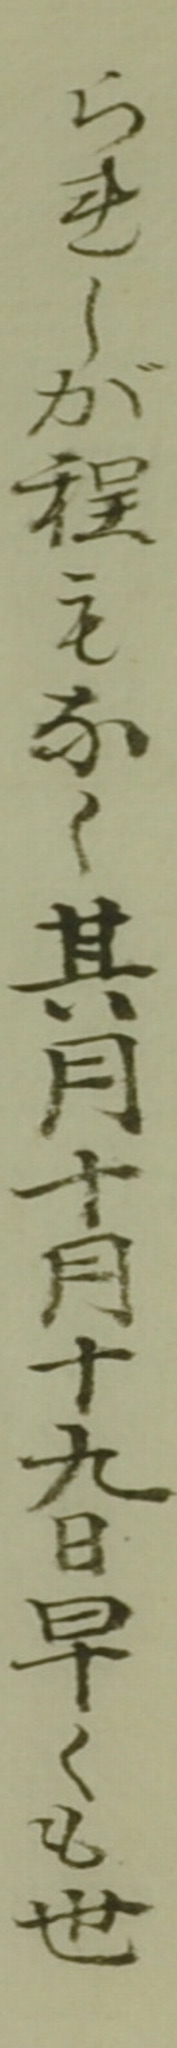られしが程もなく其月十月十九日早くも世
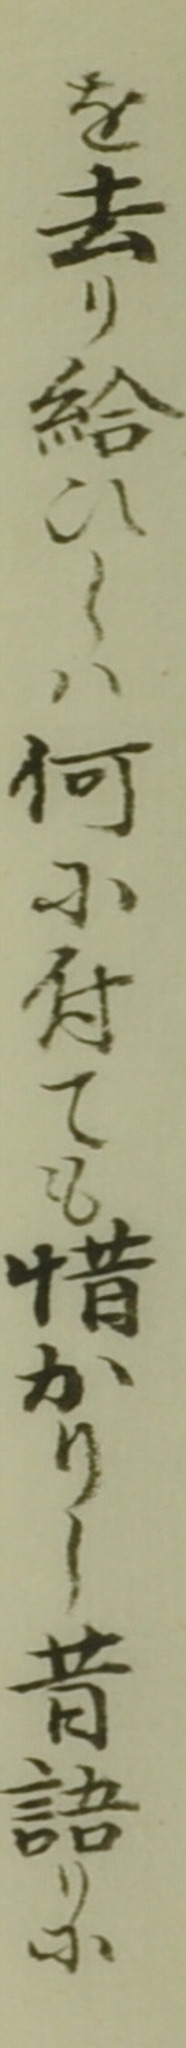を去り給ひしは何に付ても惜かりし昔語りに

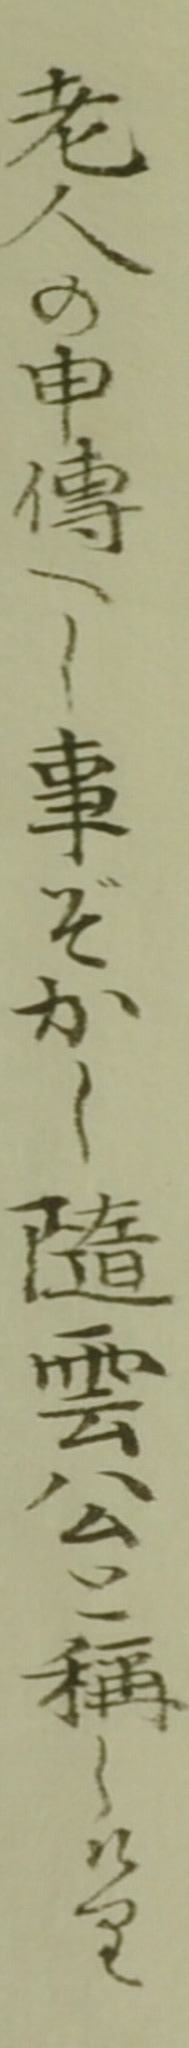老人の申伝へし事ぞかし随雲公と称しけり
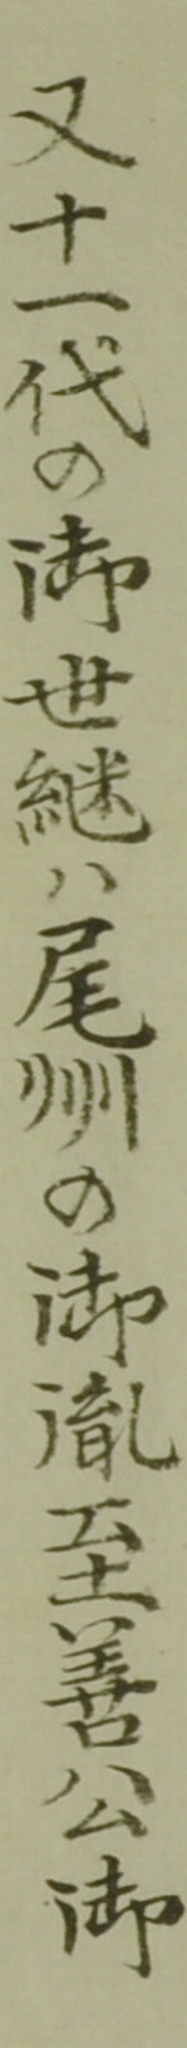又十一代の御世継は尾州の御胤至善公御
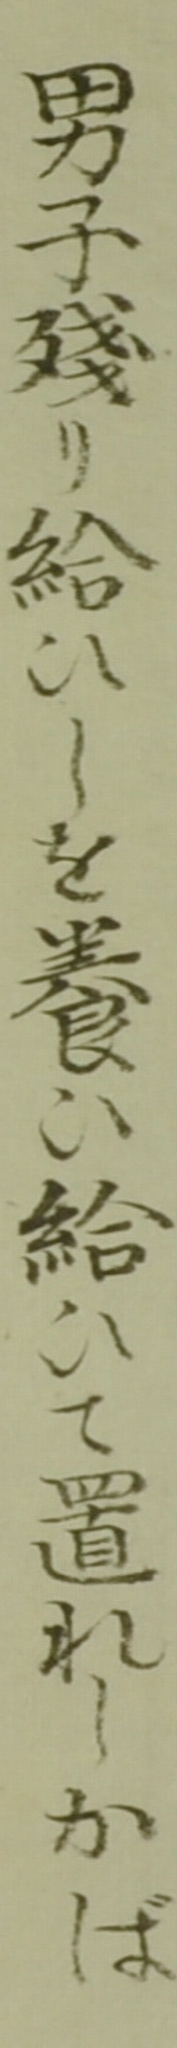男子残り給ひしを養ひ給ひて置れしかば
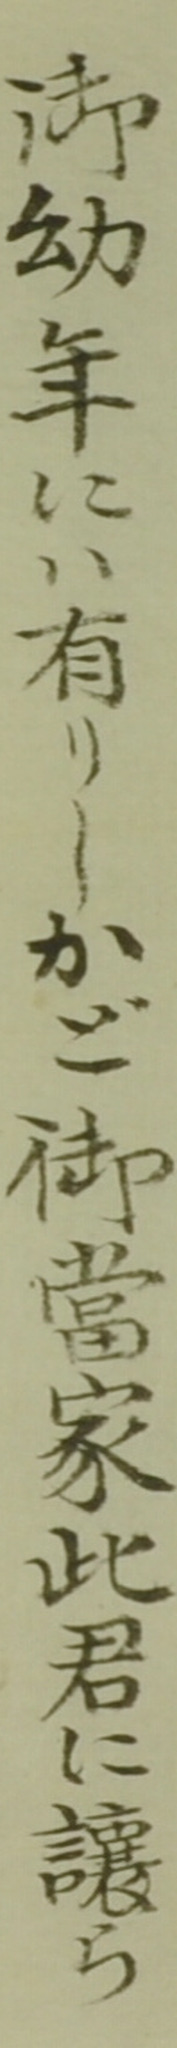御幼年には有りしかど御当家此君に譲ら
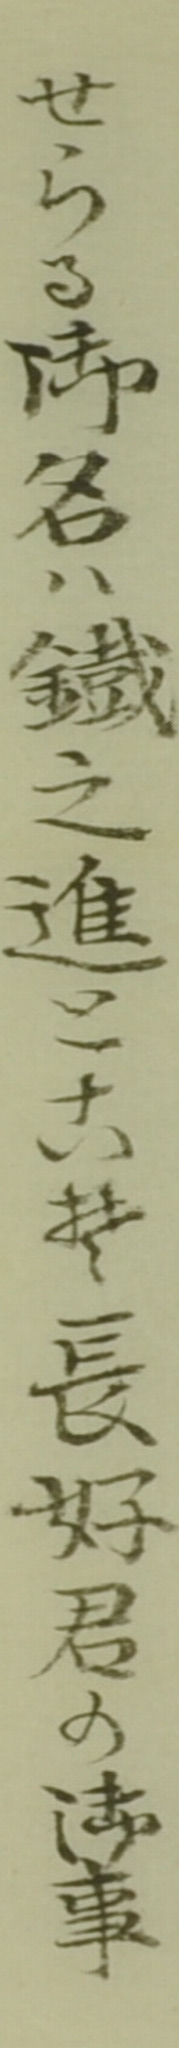せらる御名は鉄之進とこそ長好君の御事
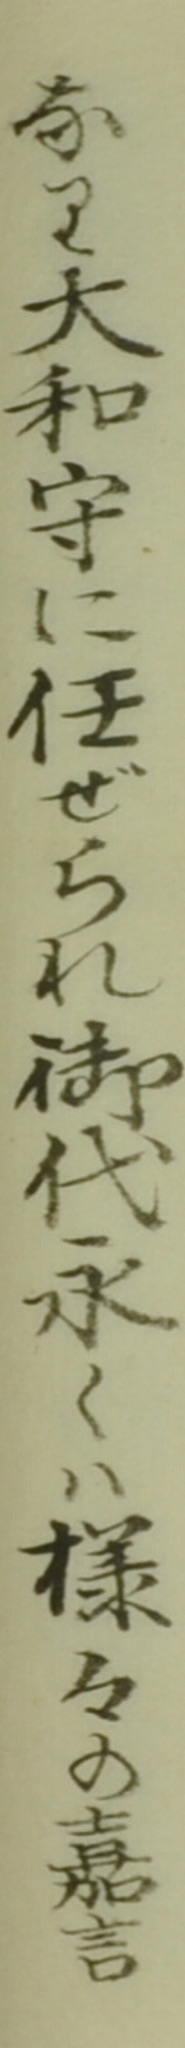なり大和守に任ぜられ御代永くは様々の嘉言
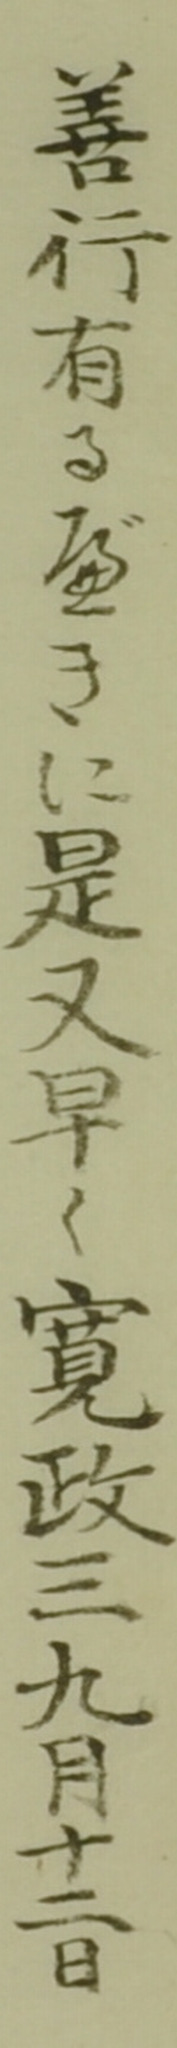善行有るべきに是又早く寛政三九月十二日
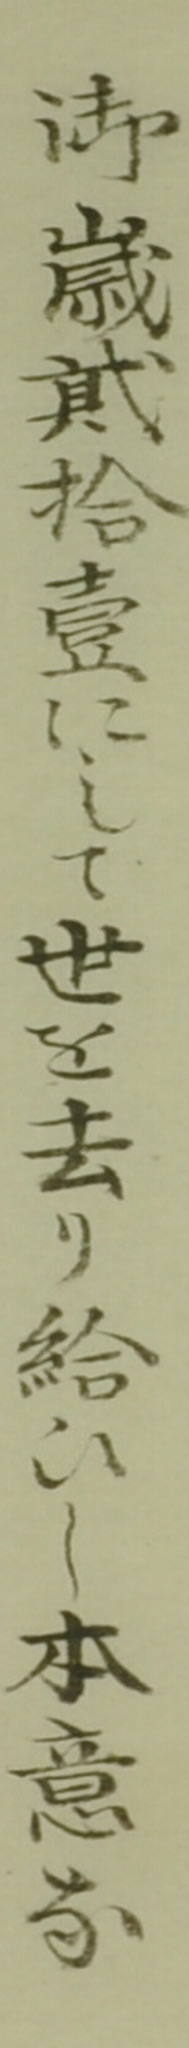御歳弐拾壱にして世を去り給ひし本意な
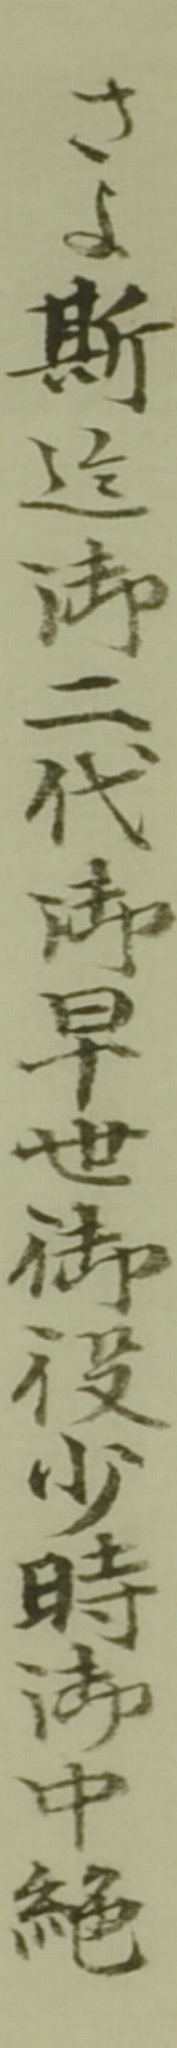さよ斯迄御二代御早世御役少時御中絶
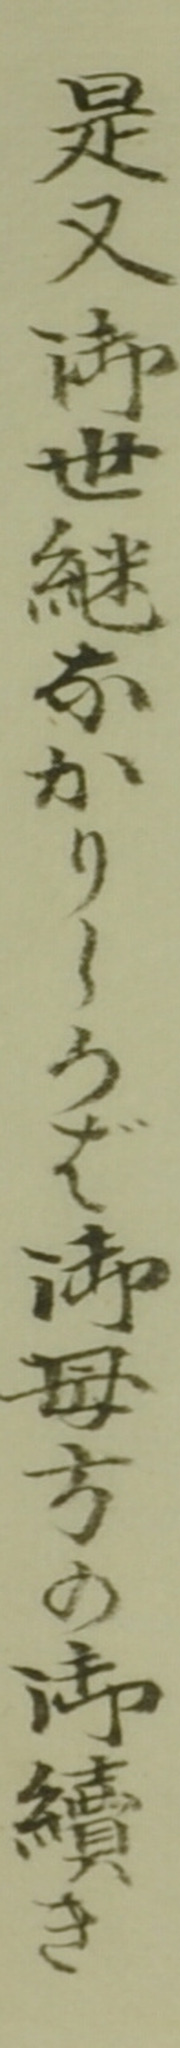是又御世継なかりしかば御母方の御続き
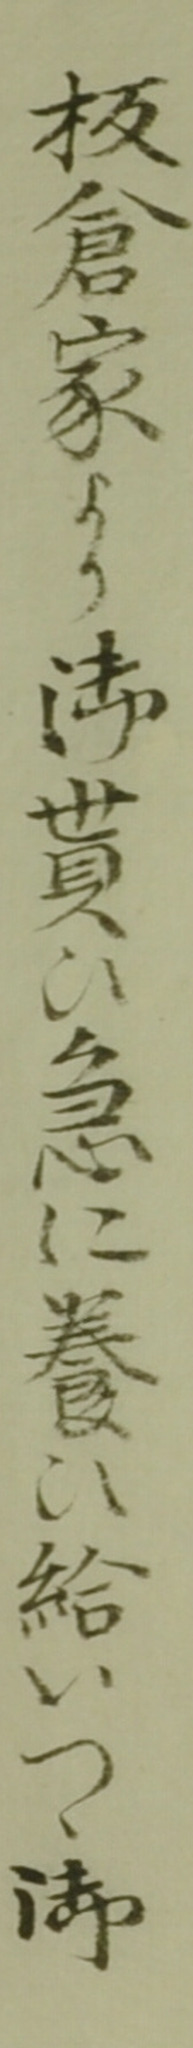板倉家より御貰ひ急に養ひ給いつゝ御
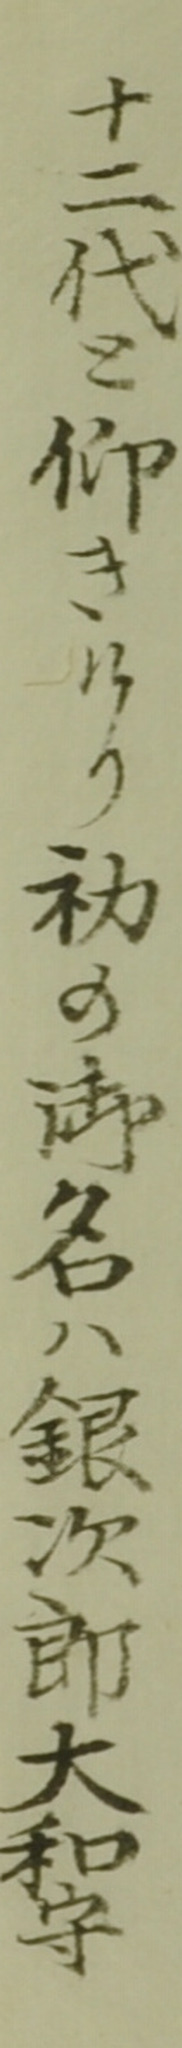十二代と仰きけり初の御名は銀次郎大和守
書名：藤葛（全）
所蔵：伊那市立高遠町図書館・合同会社AMANE
